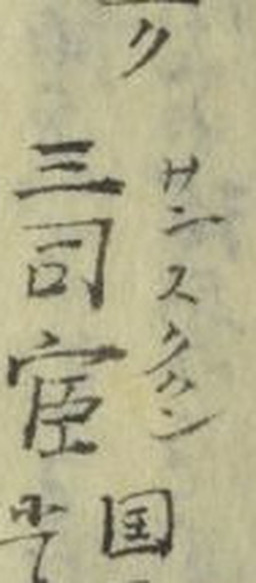三司宦
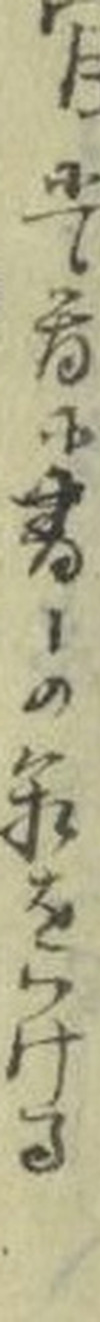にて音に書しの箱をつける
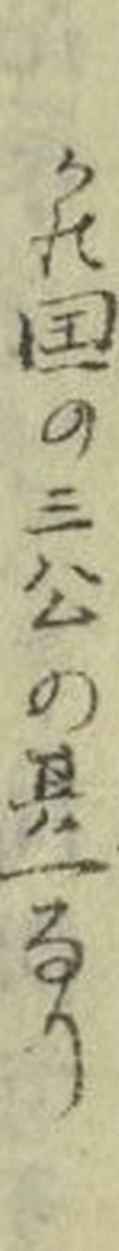かの国の三公の其一なり
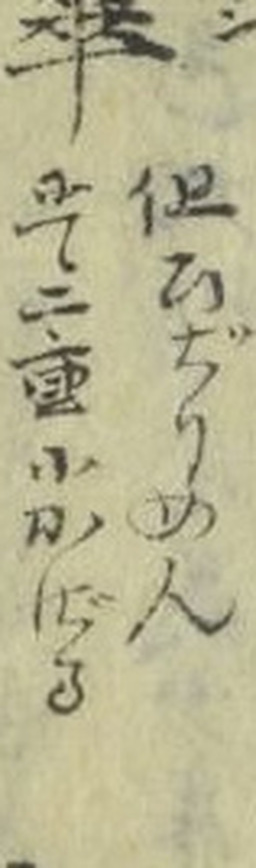にて二重にかざる
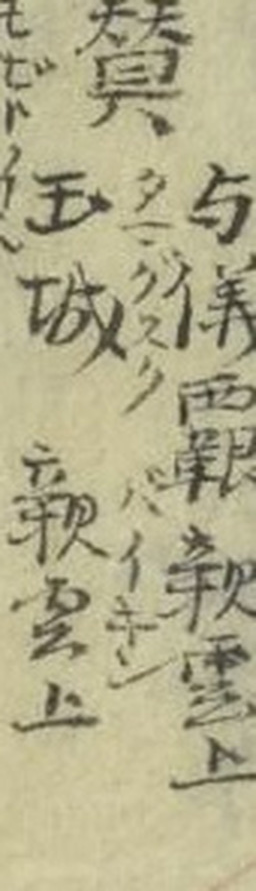玉城親雲上
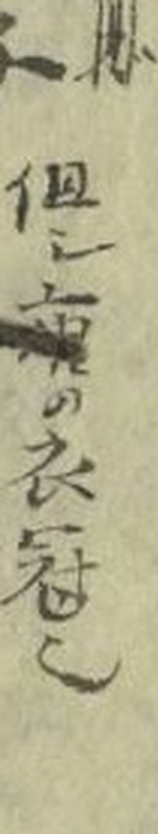但シ唐の衣冠也
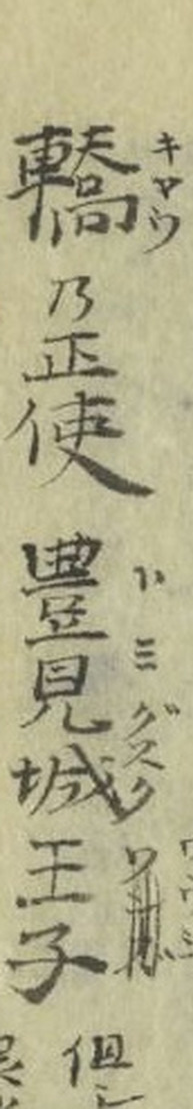轎乃正使豊見城王子
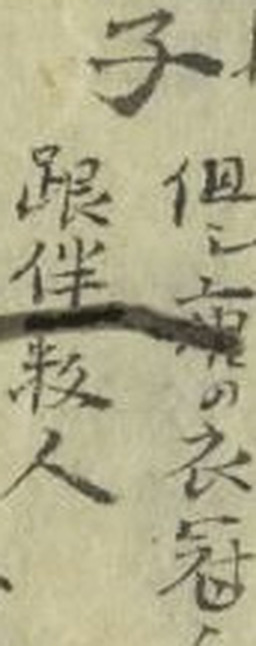跟伴数人
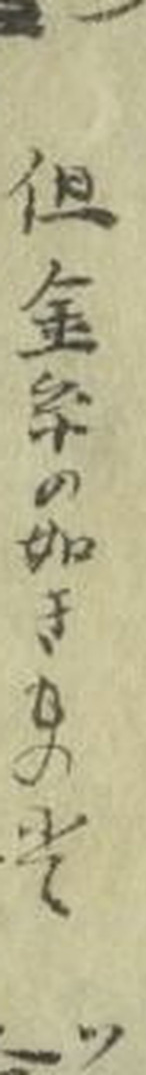但金糸の如きものにて

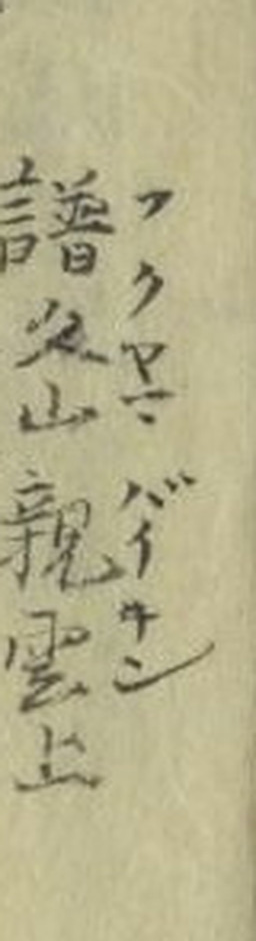読谷山親雲上
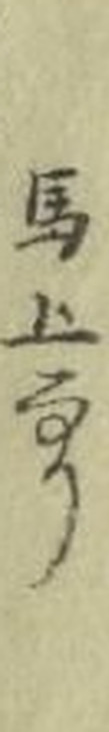馬上なり
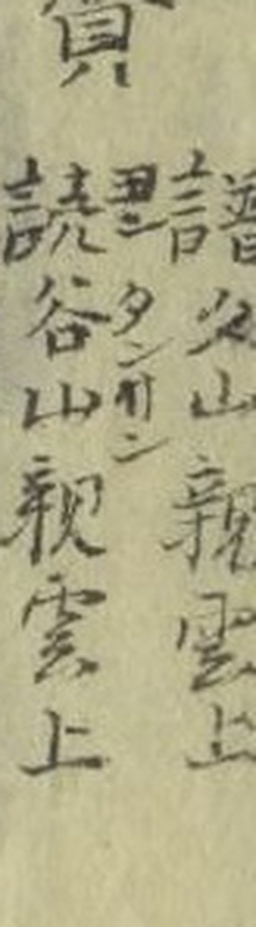読谷山親雲上
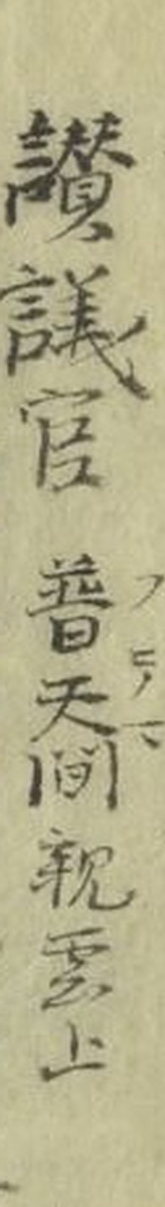讃議官普天間親雲上
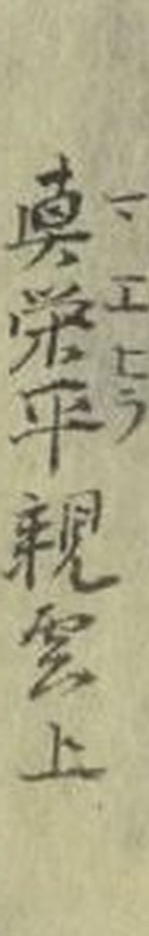真栄平親雲上
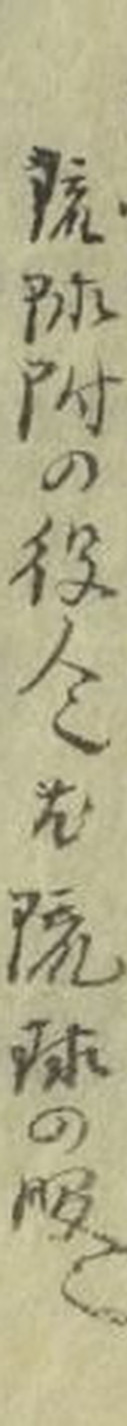琉球附の役人也ば琉球の服也
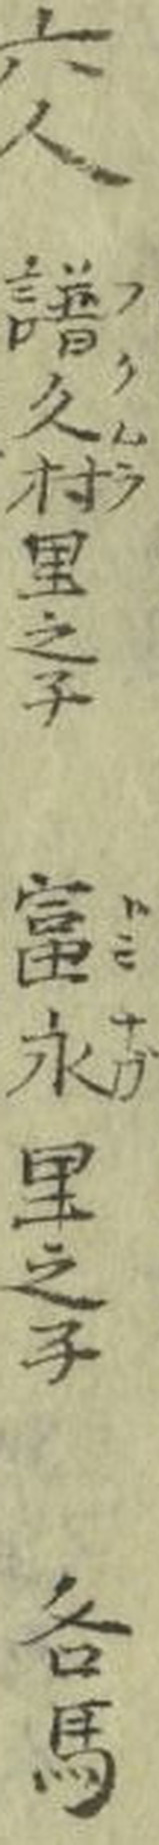譜久村里之子富永里之子各馬上也
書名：天保三年来朝 琉球人行列記
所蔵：University of the Ryukyus Library
